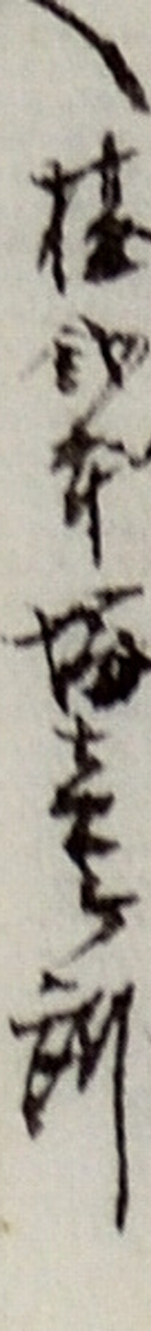椹弐本塚壱ヶ所
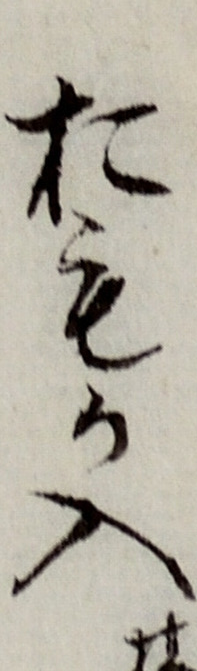おもか入
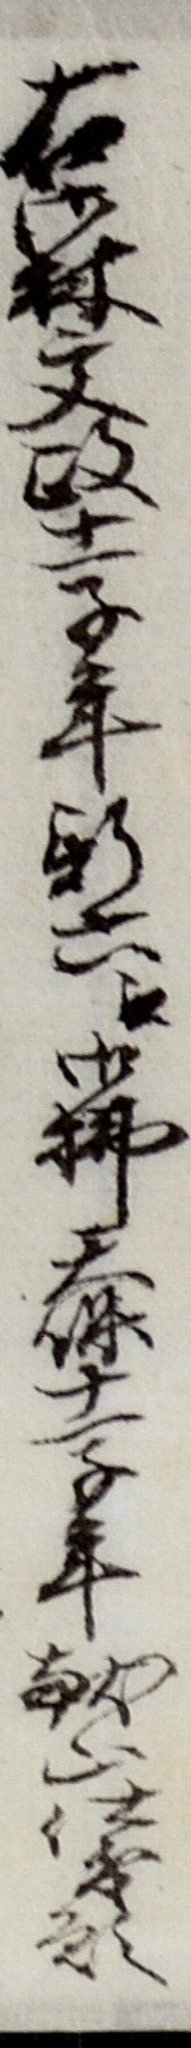右御林文政十一子年新六え御払天保十一子年献山仕度願
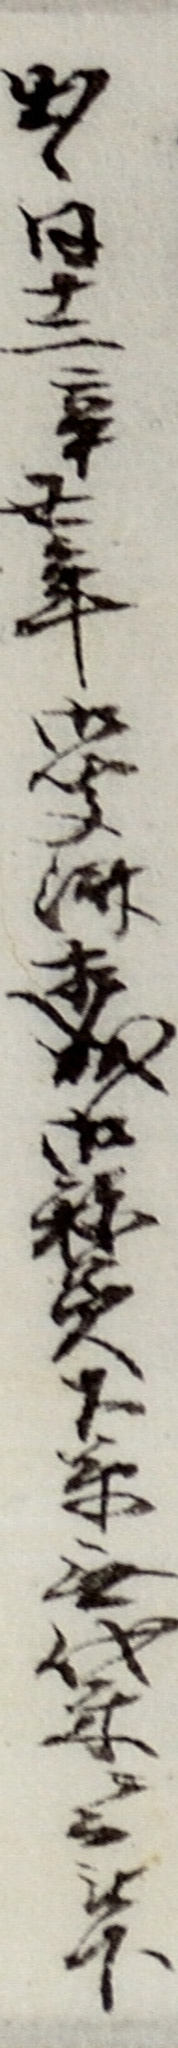出候同十二辛丑年御聞済相成御称美下草無代米ニ而被下
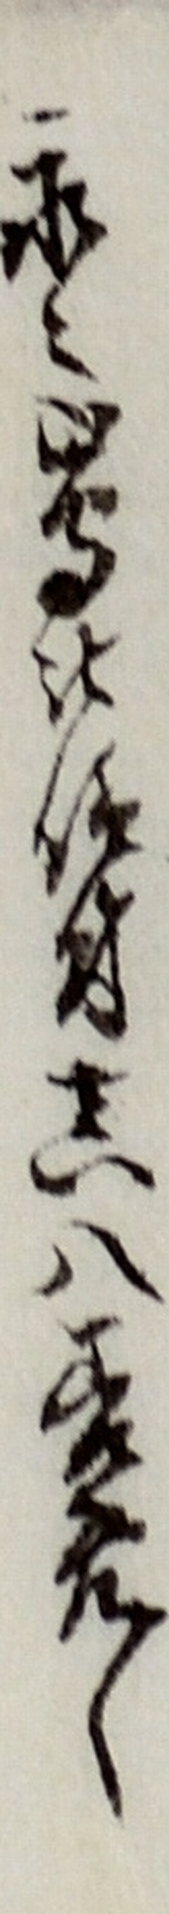永々山守被仰付真八差免候
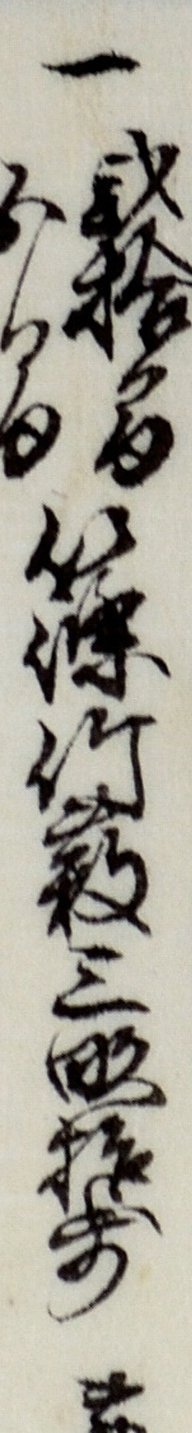一弐拾間五間篠竹藪三畝拾歩
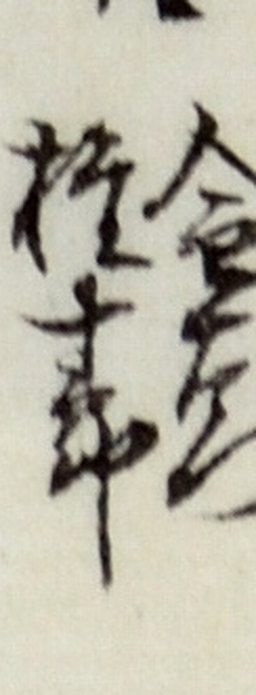権十郎
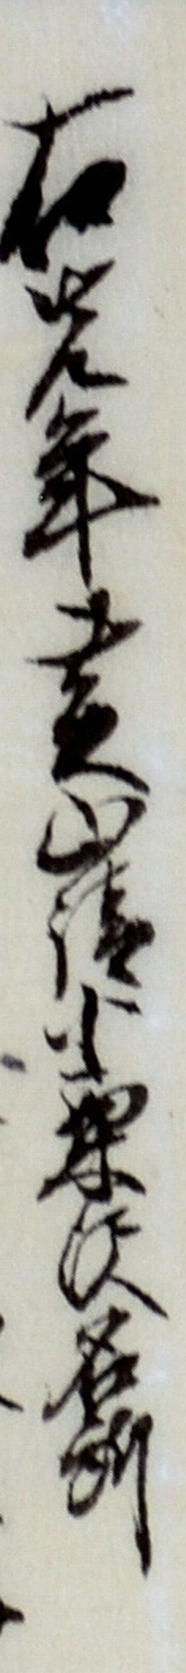右先年芝山請分小栗沢名所
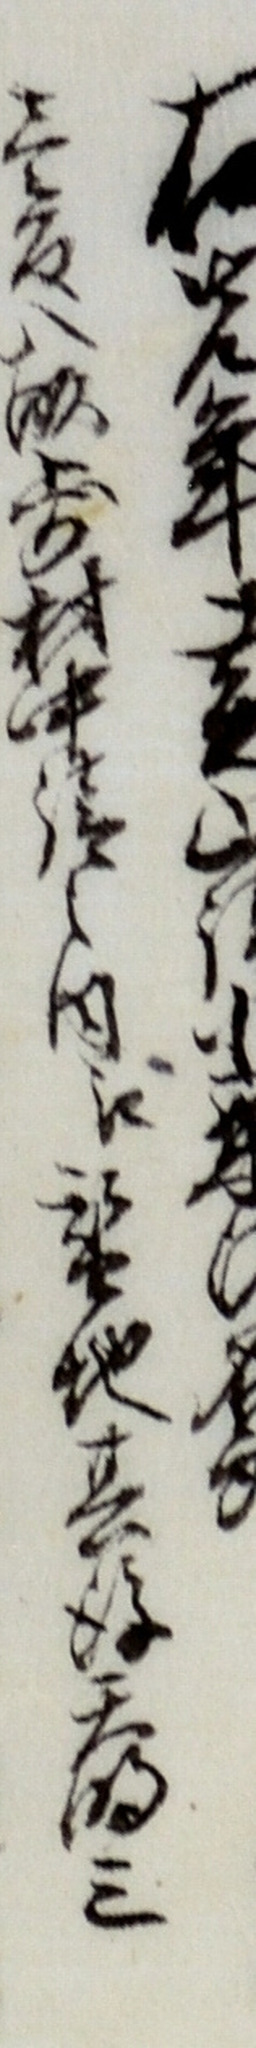壱反八畝歩村中請之内え替地其後天明三
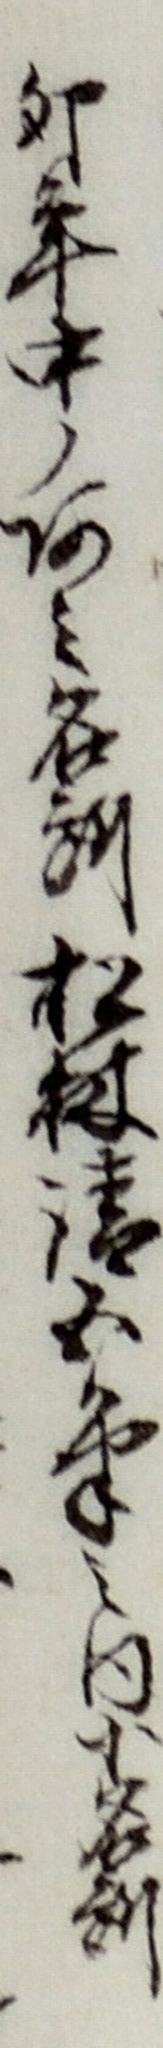卯年中ノあみ名所松林請五筆之内小名所
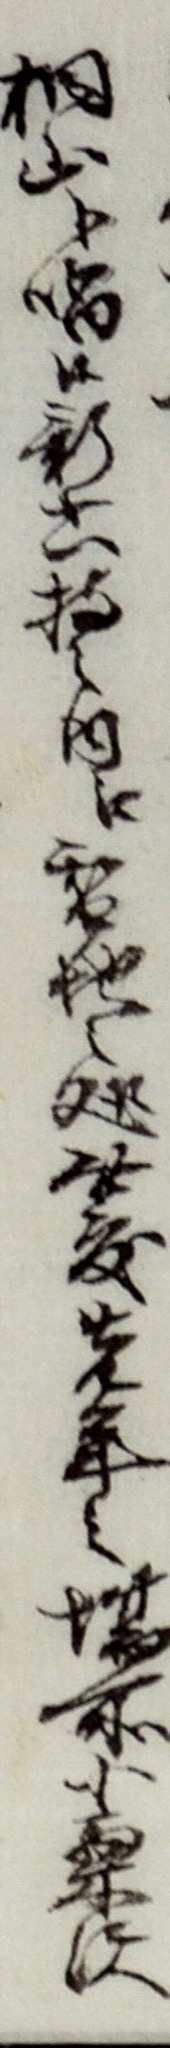桐山ト唱候新六持之内え替地之処此度先年之場所小栗沢
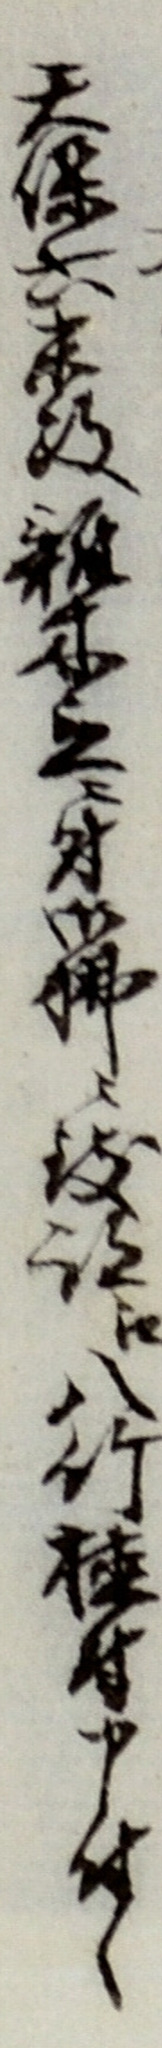天保六末改雑木立ニ付御払被致跡え八竹植付申付候
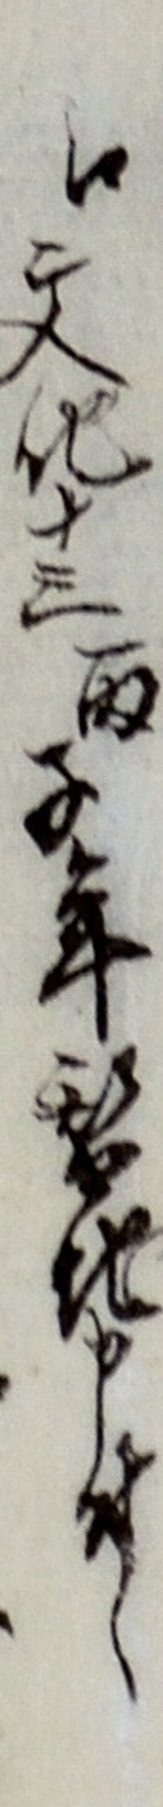え文化十三丙子年替地申付候

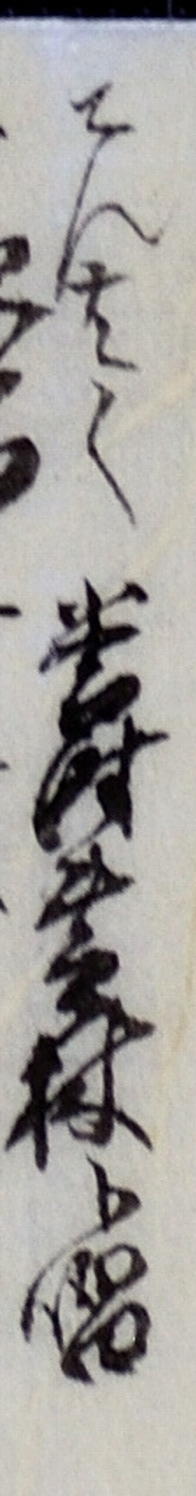てんはく当時芝林ト唱
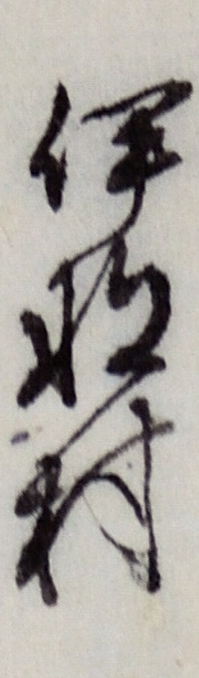伊那村
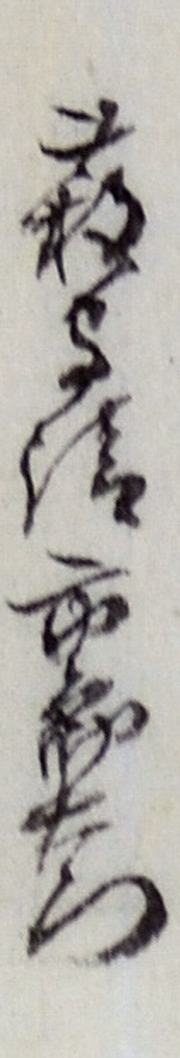藪守請市郎右衛門
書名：山林帳草稿
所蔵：伊那市立高遠町図書館・合同会社AMANE
